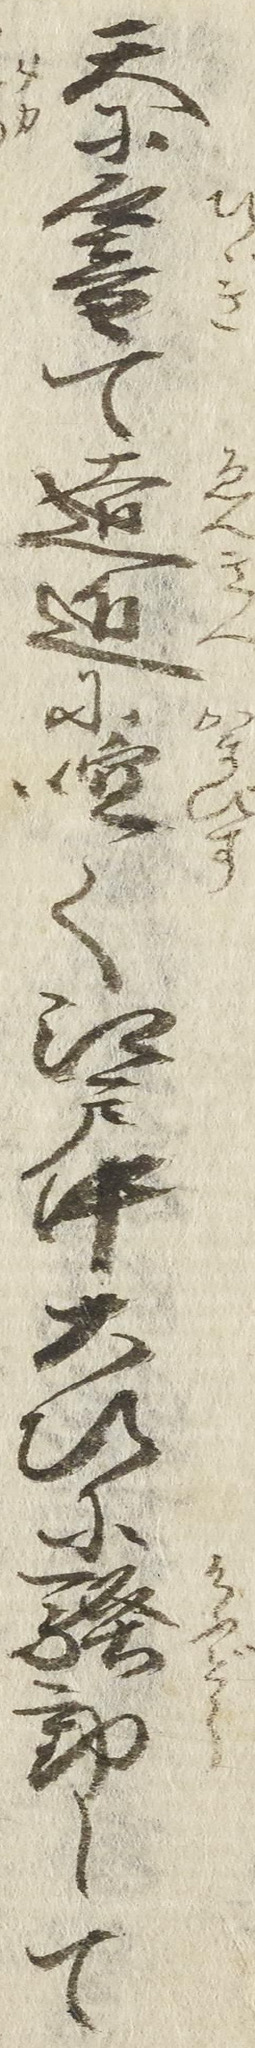天に響て遠近に喧く江戸中大ひに騒動して
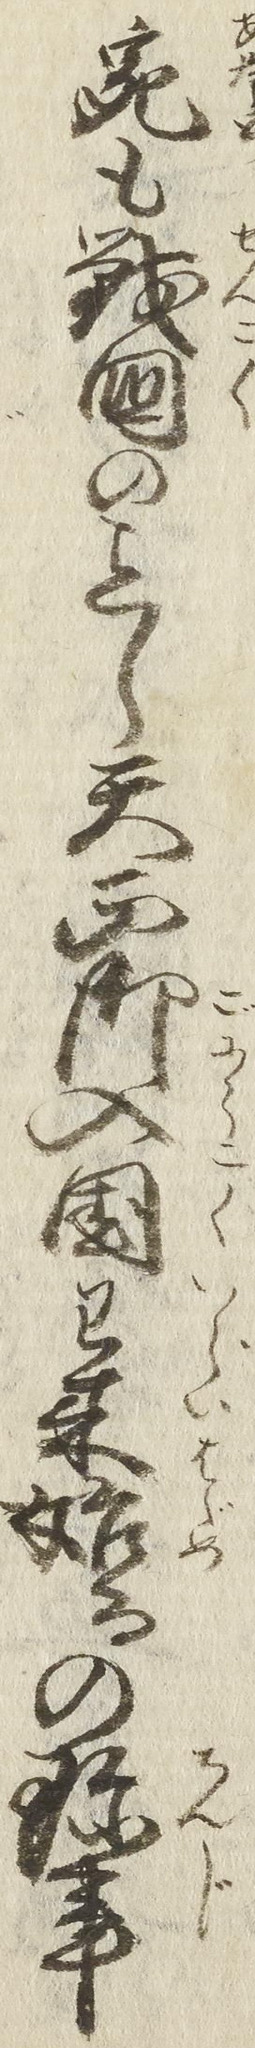宛も戦国のことし天正御入国已来始ての珍事
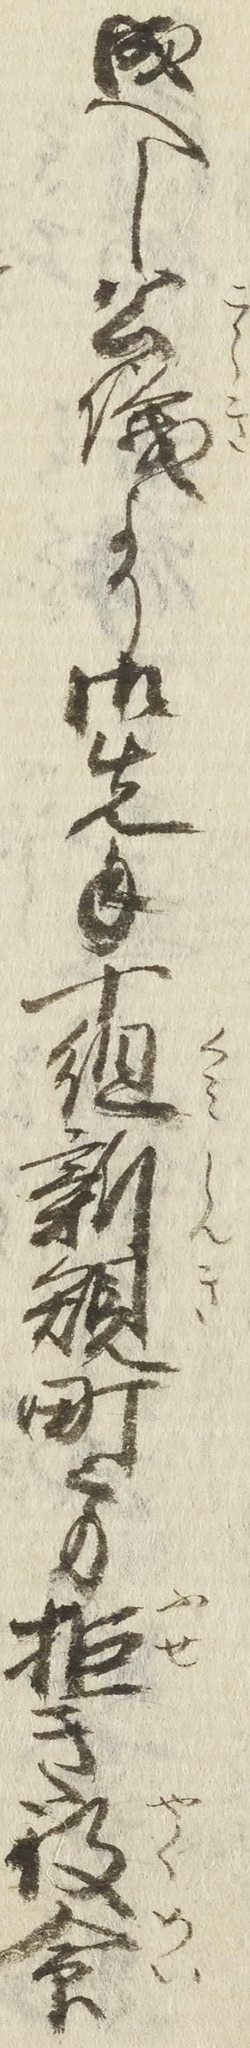成へし公儀より御先手十組新規町方拒き役命
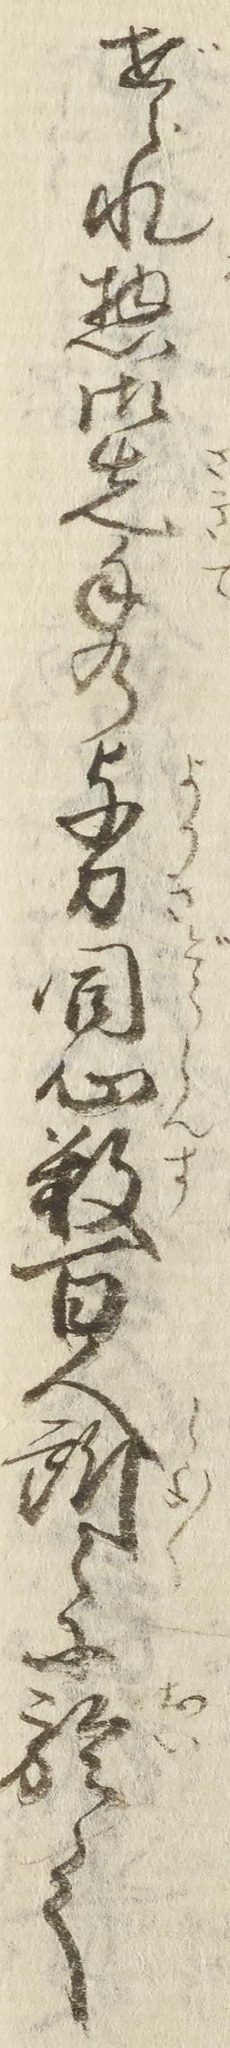ぜられ惣御先手の与力同心数百人所〻に於て
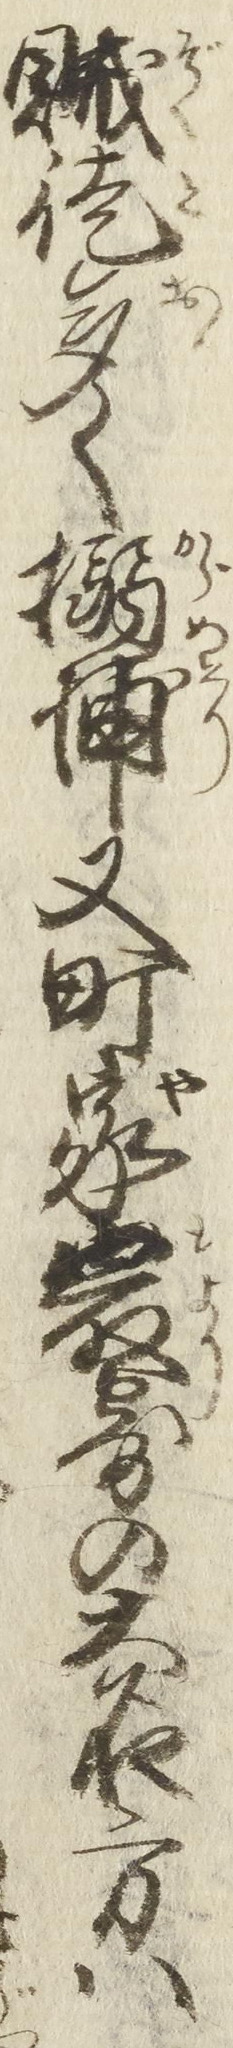賊徒多く搦捕又町家最寄の大名方は
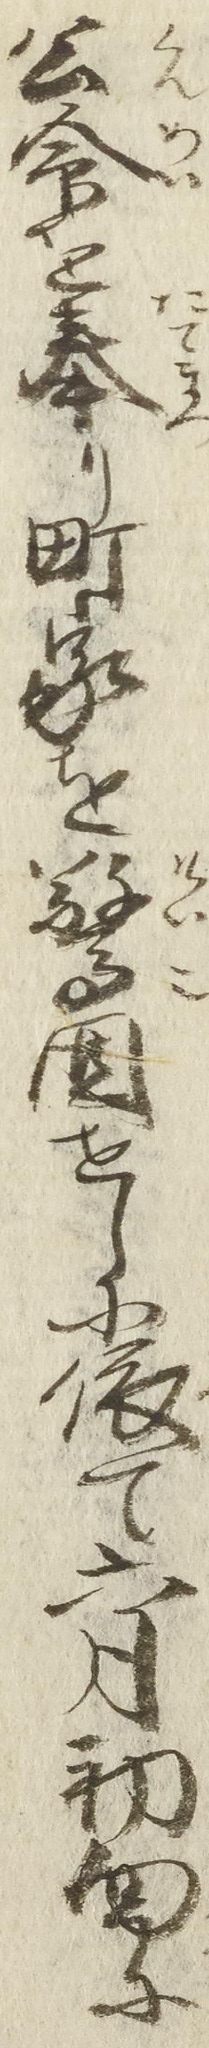公命を奉り町家を警固せしに依て六月初旬に
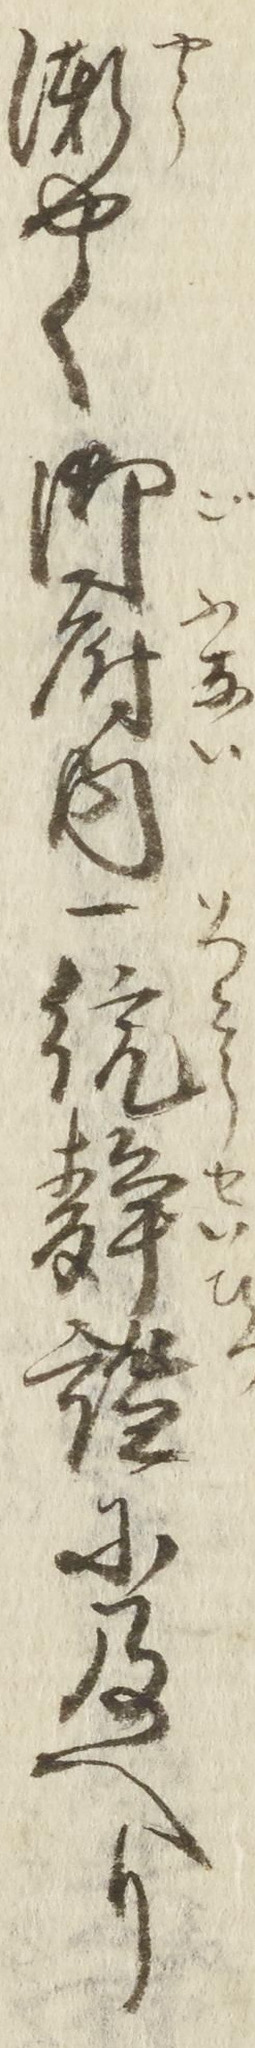漸やく御府内一統静謐に及へり
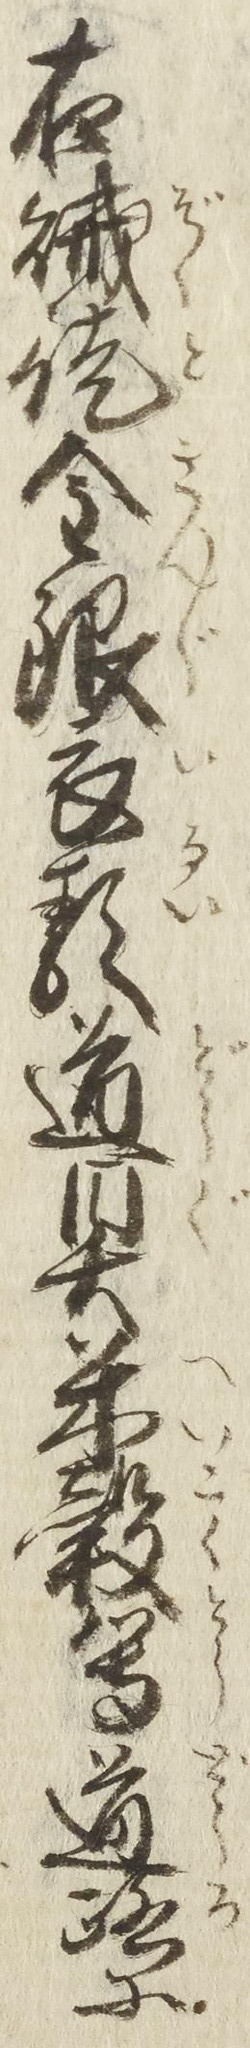右賊徒金銀衣類道具米穀当道路に
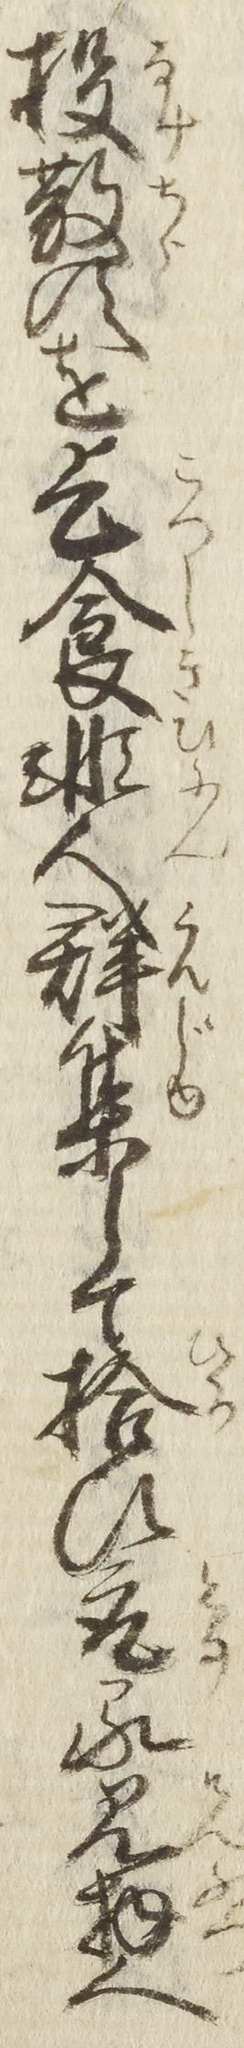投散すを乞食非人群集して拾ひ取る見物人
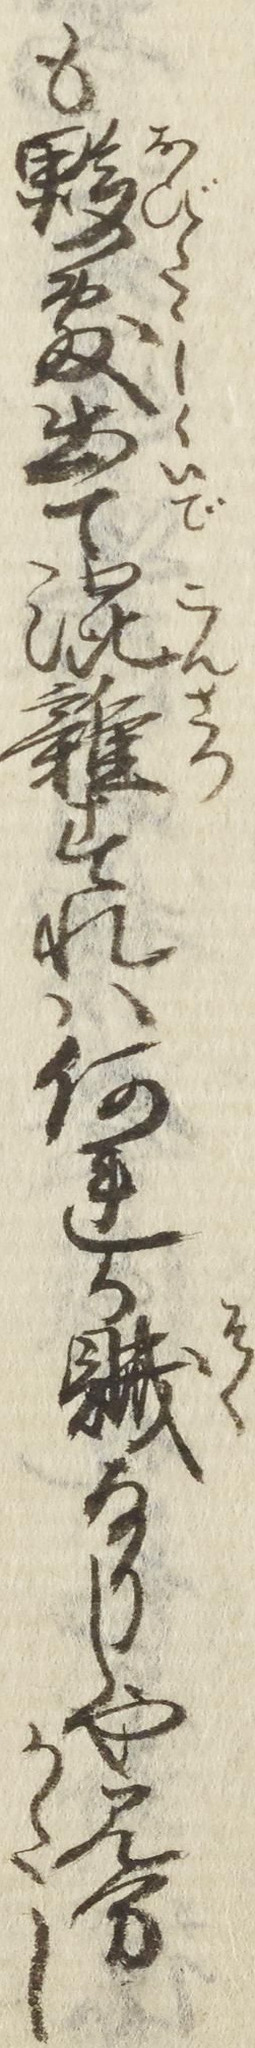も夥敷出て混雑すれは何れか賊なりや見分かたし
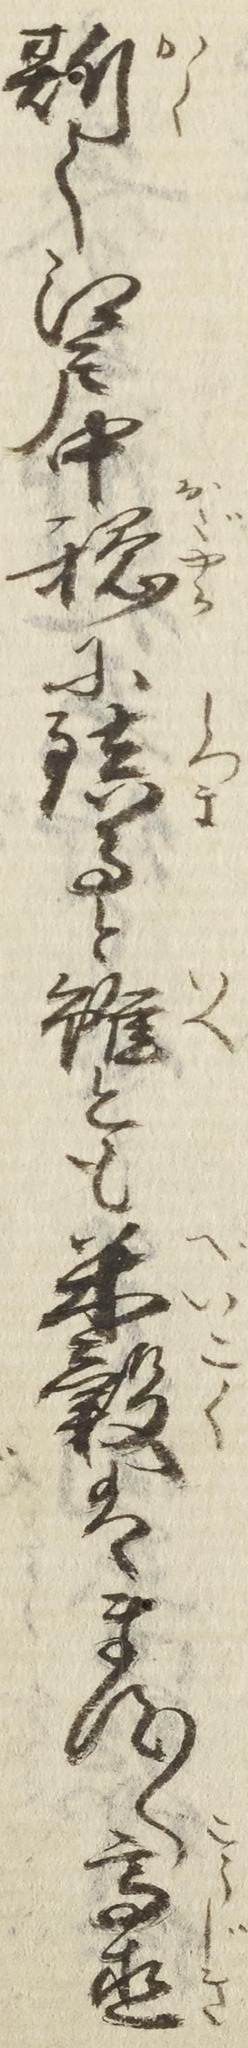斯て江戸中穏に鎮ると雖とも米穀はます〳〵高直
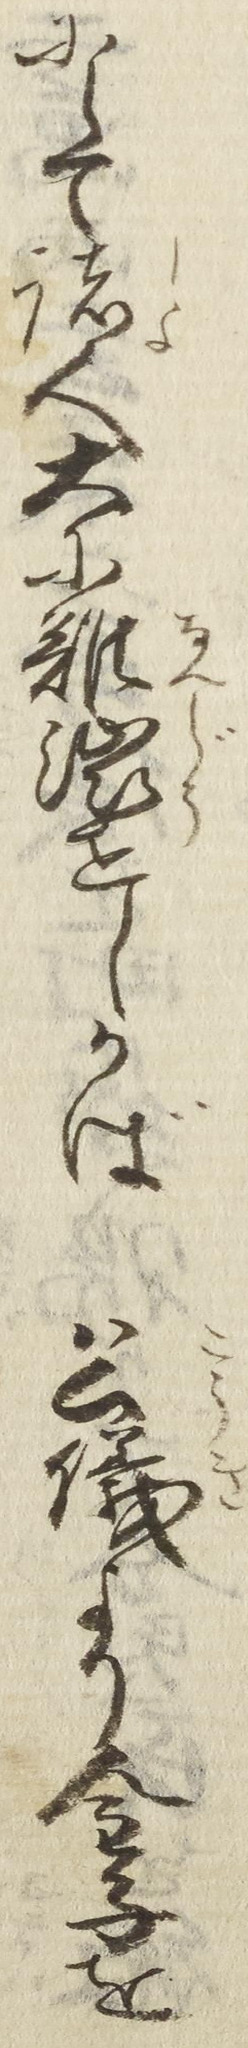にして諸人大に難渋せしかば公儀より金子を

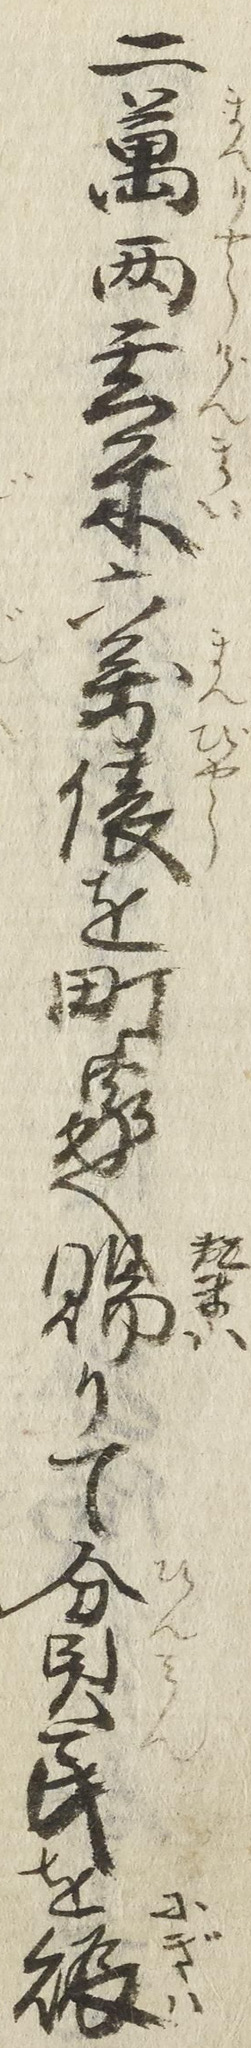ニ萬両玄米六萬俵を町家へ賜りて貧民を賑
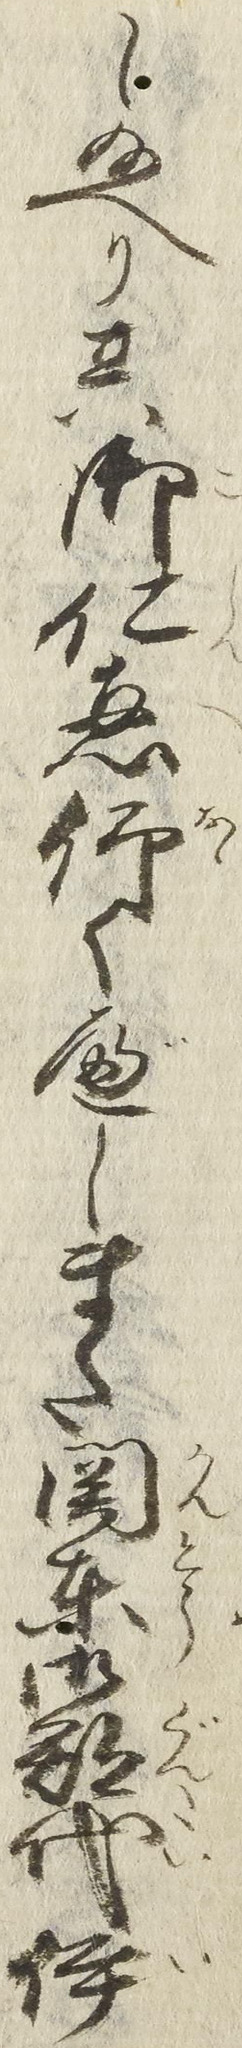し給へり其御仁恵仰くべしまた関東御郡代伊
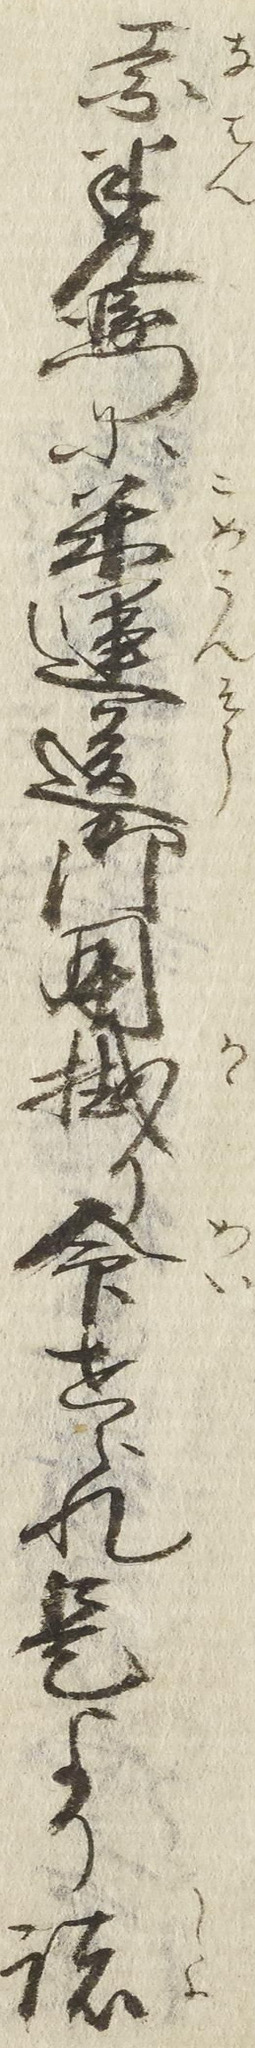奈半左衛門に米運送御用掛り命せられ是より諸
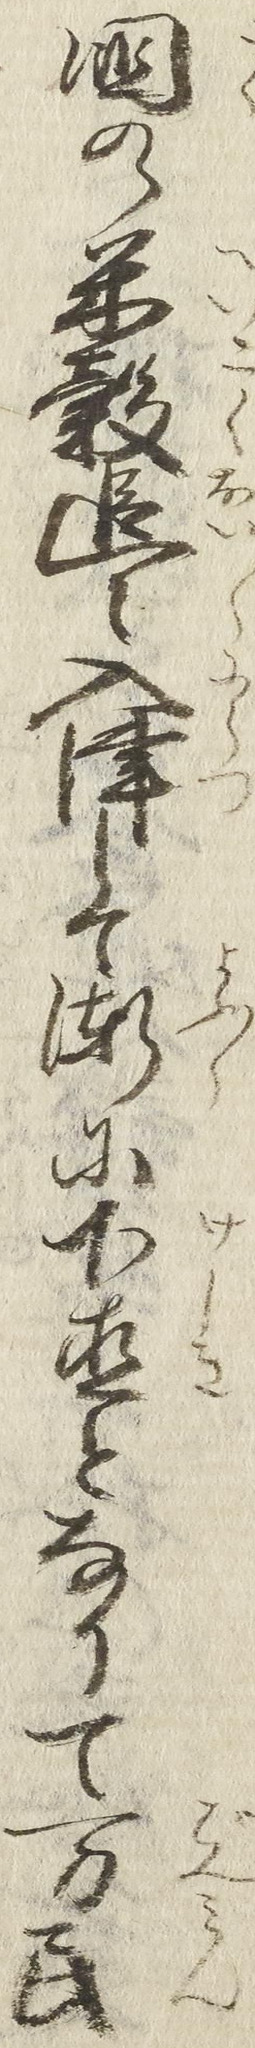国の米穀追〻入津して漸に下直となりて万民
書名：天明奇畧　全
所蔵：東京大学地震研究所図書室 Earthquake Research Institute Library, The University of Tokyo, JAPAN
